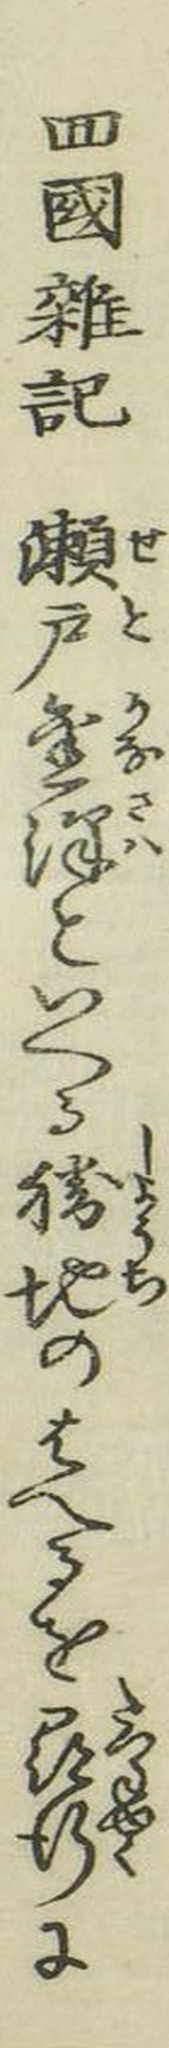四國雜記瀬戸金澤といへる勝地のはへるを尋行に

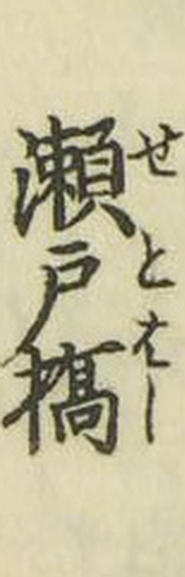瀬戸橋

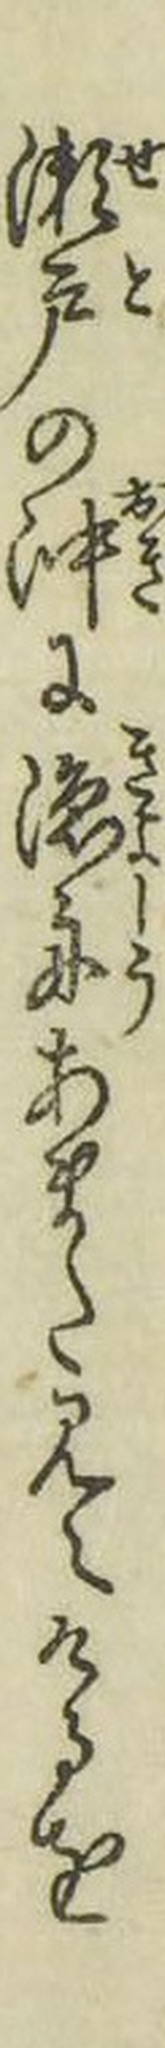瀬戸の沖に漁舟あまた見えけるを
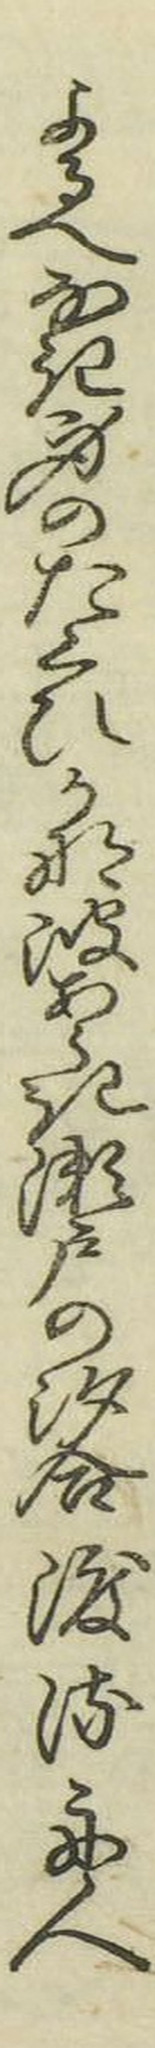よるへなき身のたくひかな波あらき瀬戸の汐合渡る舟人道興准后
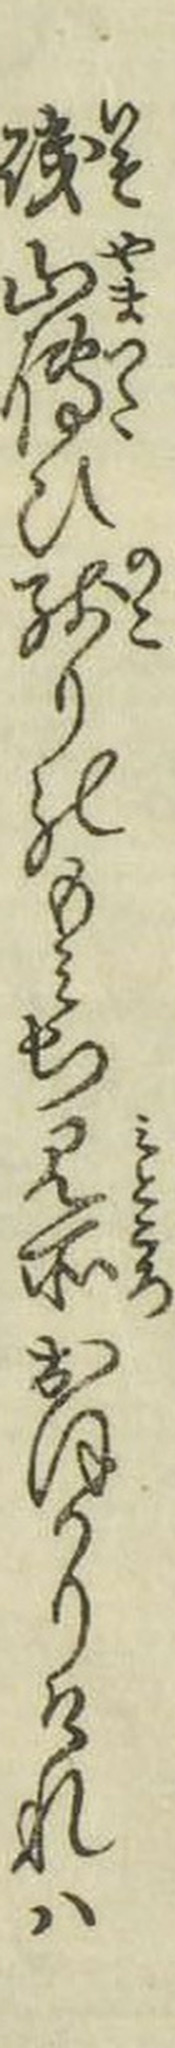磯山傳ひ残りのもみち見所おほかりけれは
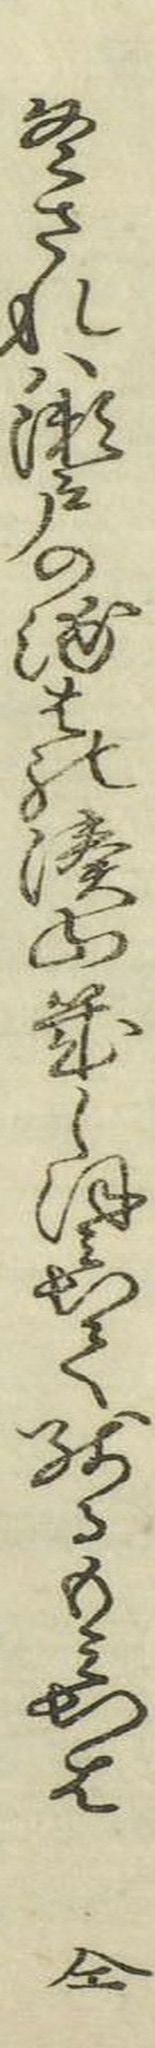冬されは瀬戸の浦はの湊山幾しほみちて残るもみちは仝
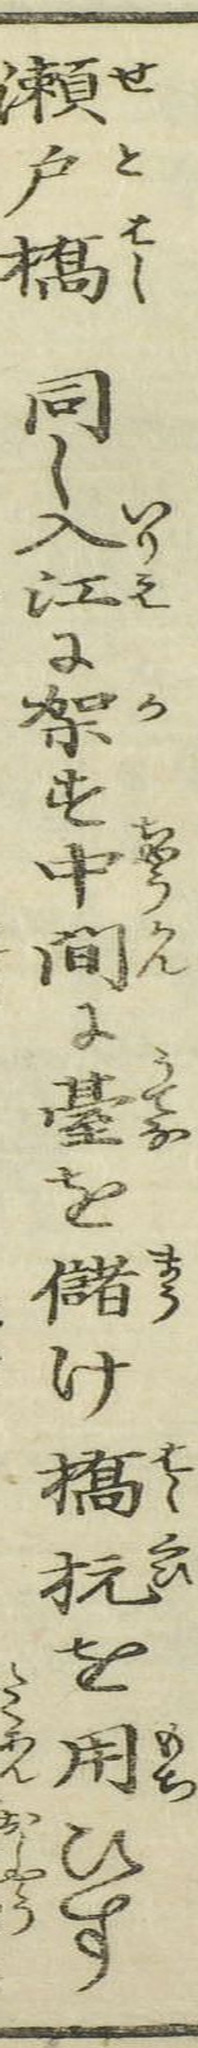瀬戸橋同し入江に架す中間に䑓を儲け橋杭を用ひす
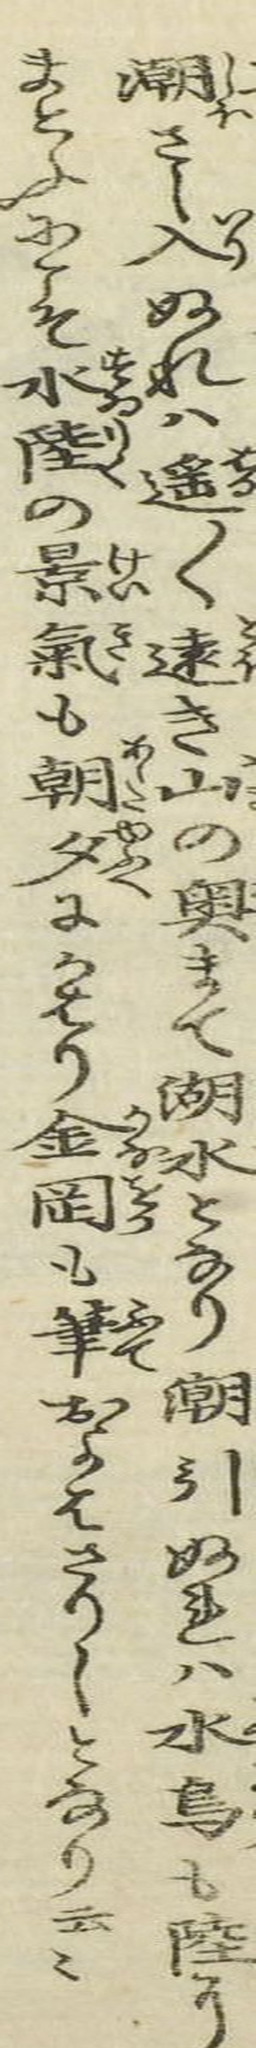まとふにこそ水陸の景氣も朝夕にかはり金岡も筆およはさりしとなり云々
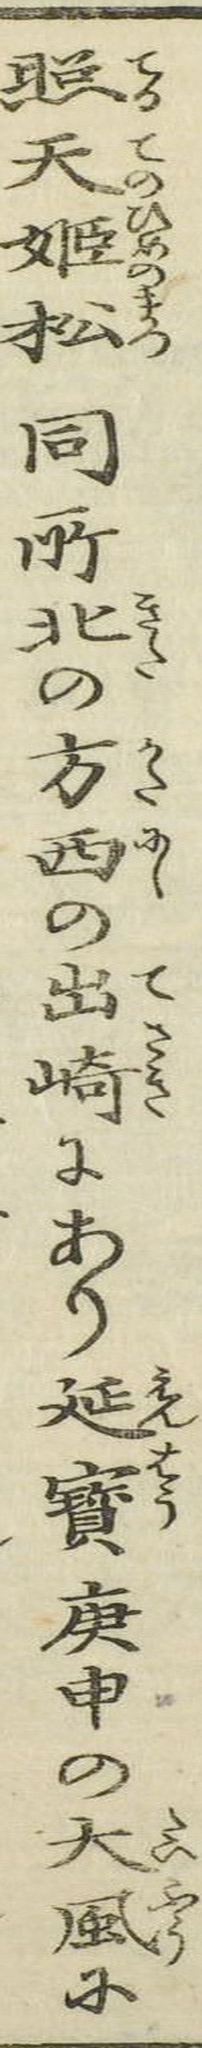照天姫松同所北の方西の出崎にあり延寳庚申の大風に
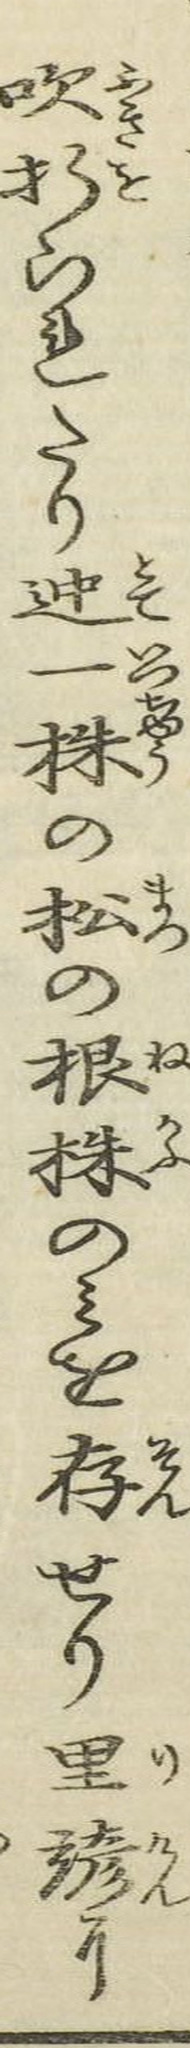吹折られたり迚一株の松の根株のみを存せり里諺に
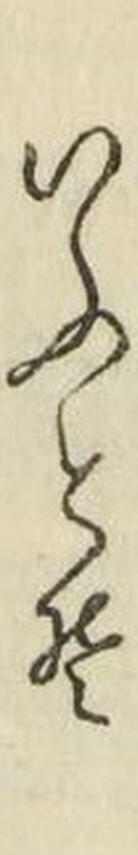いふとそ
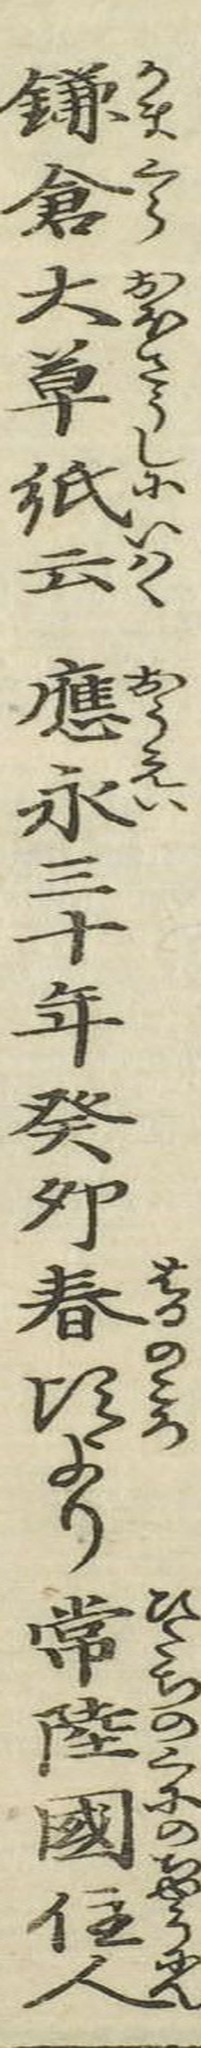鎌倉大草紙云應永三十年癸卯春頃より常陸國住人
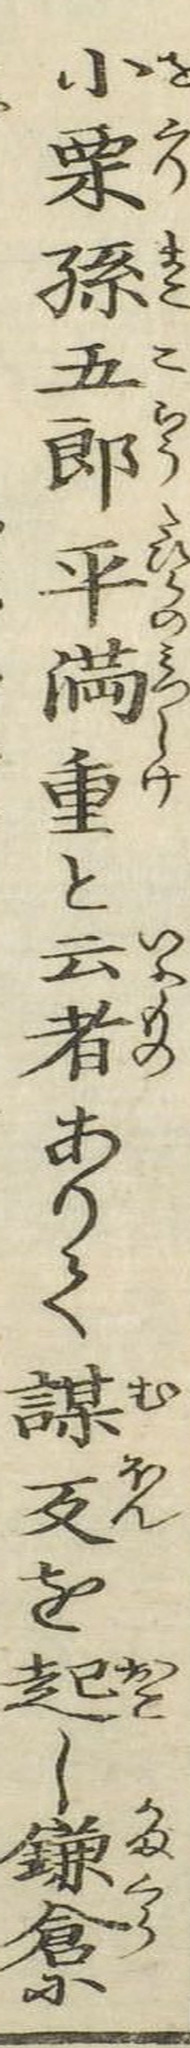小栗孫五郎平満重と云者ありて謀反を起し鎌倉に
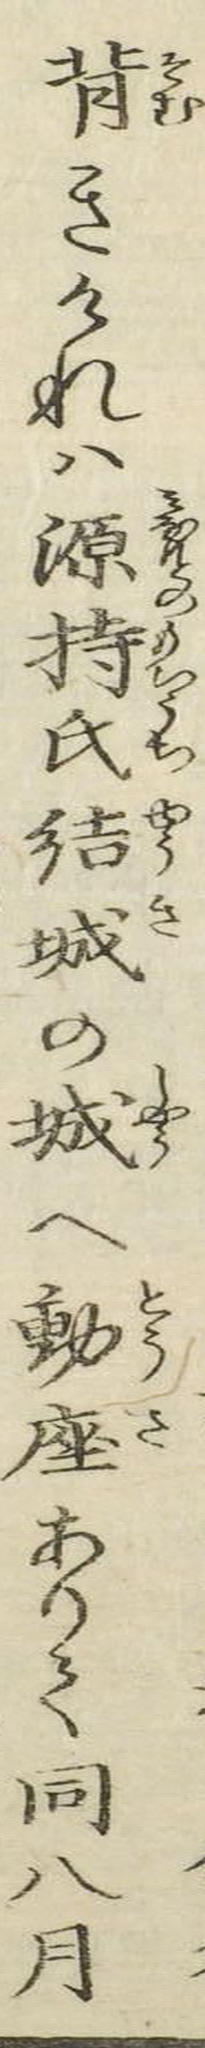背きけれは源持氏結城の城へ動座ありて同八月
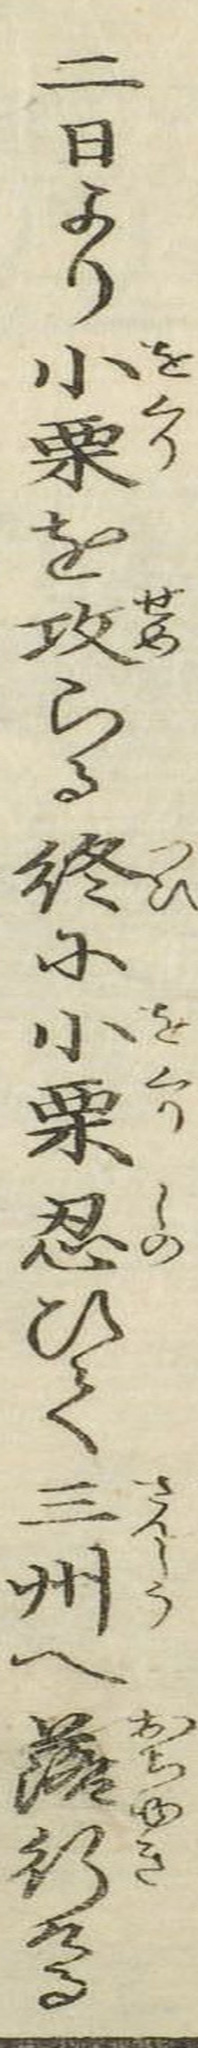二日より小栗を攻らる終に小栗忍ひて三州へ落行ける
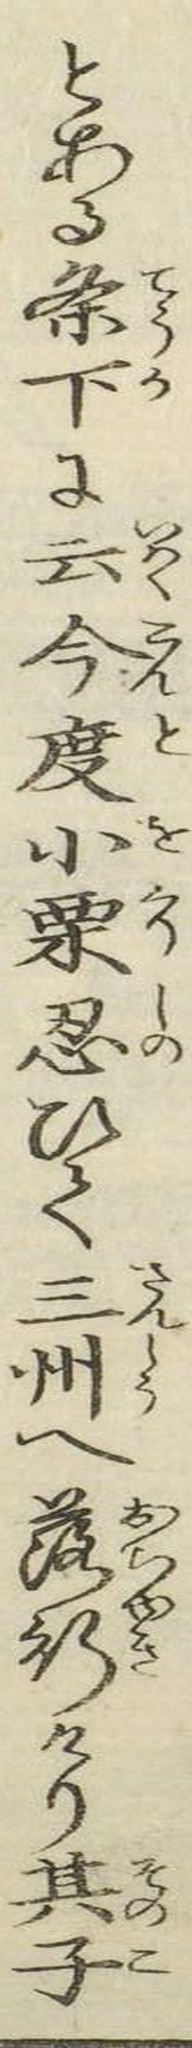とある条下に云今度小栗忍ひて三州へ落行けり其子
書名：江戸名所図会 20巻 巻之6
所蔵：東京学芸大学教育コンテンツアーカイブ
